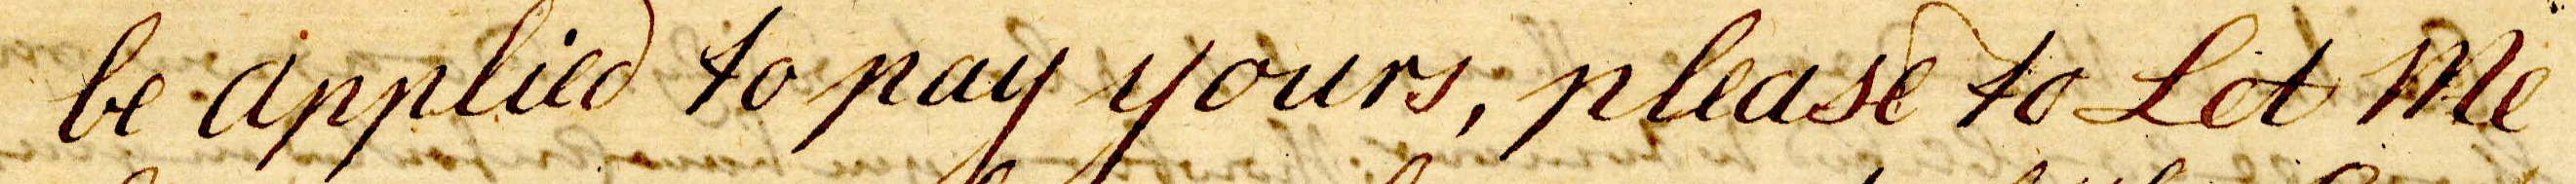be applied to pay Yours, please to Let Me
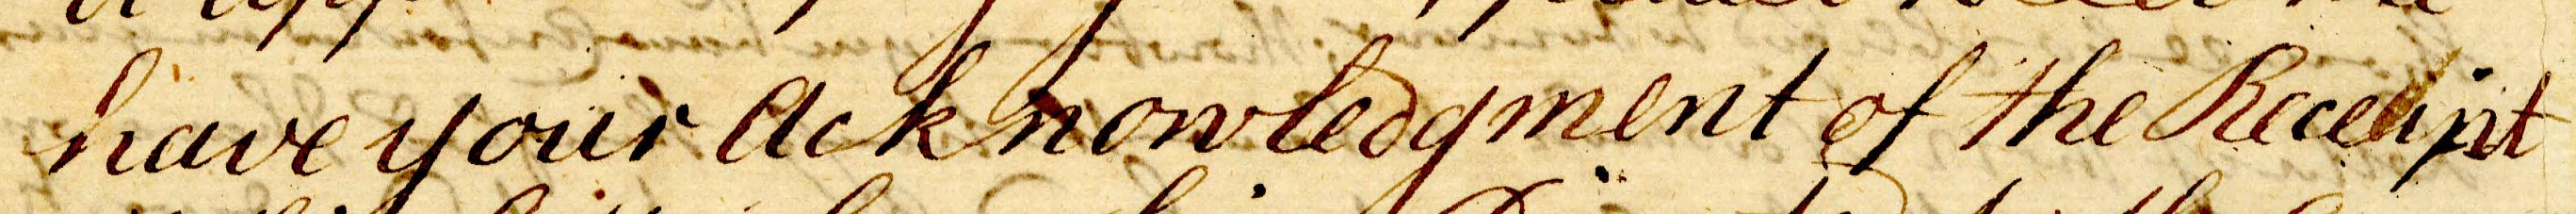have Your acknowledgment of the Receipt
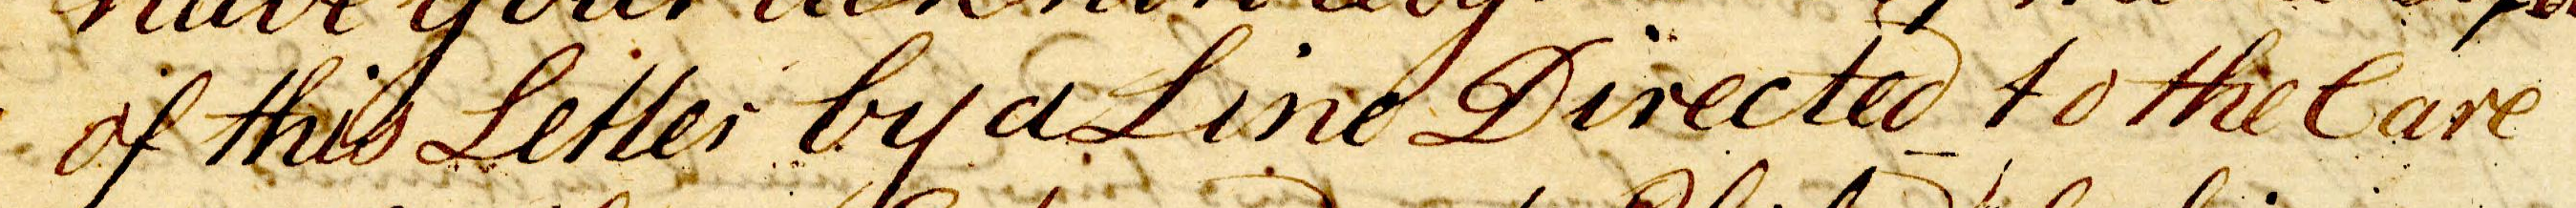of this Letter by a Line Directed to the Care
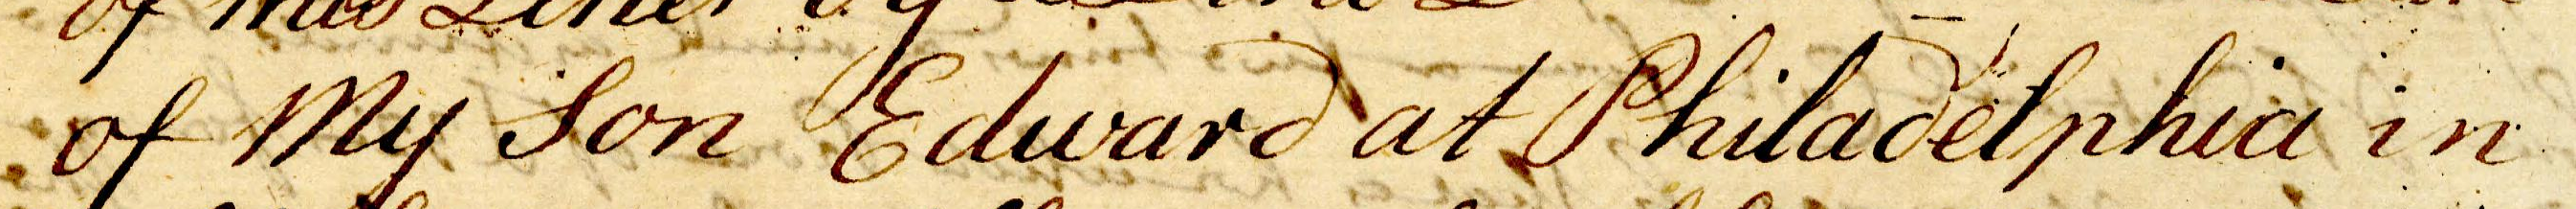of My son Edward at Philadelphia in
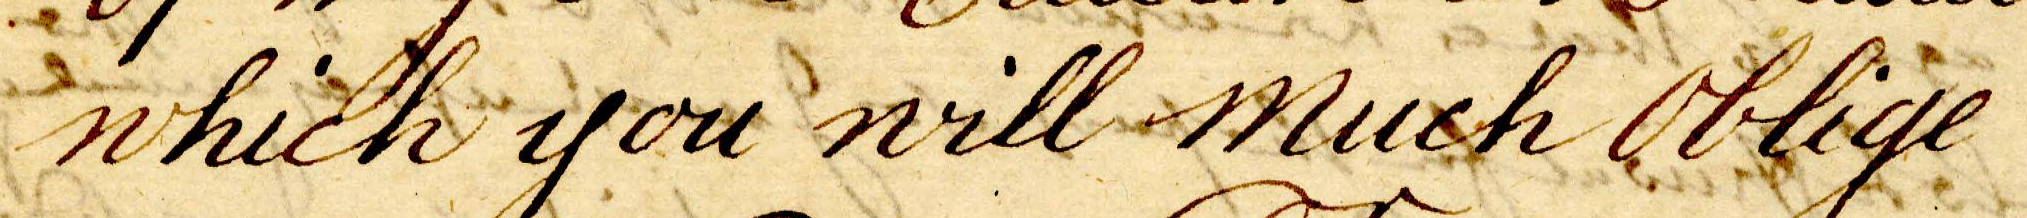which you will Much Oblige
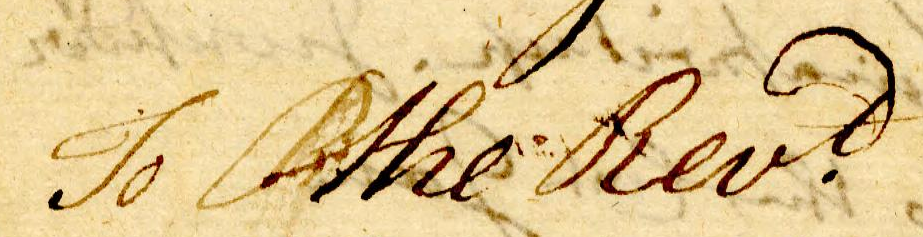To the Rev^d.
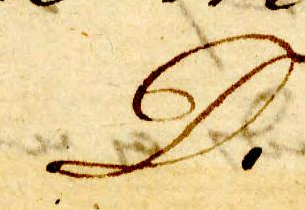D^r.
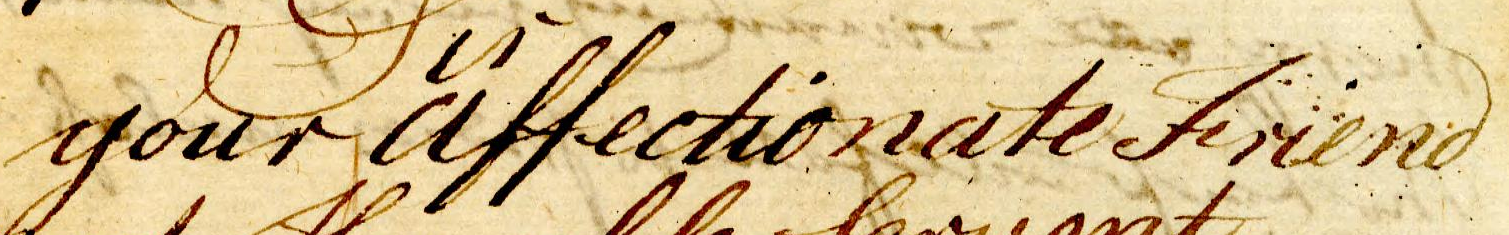your affectionate Friend
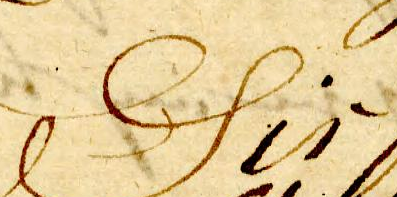Sir
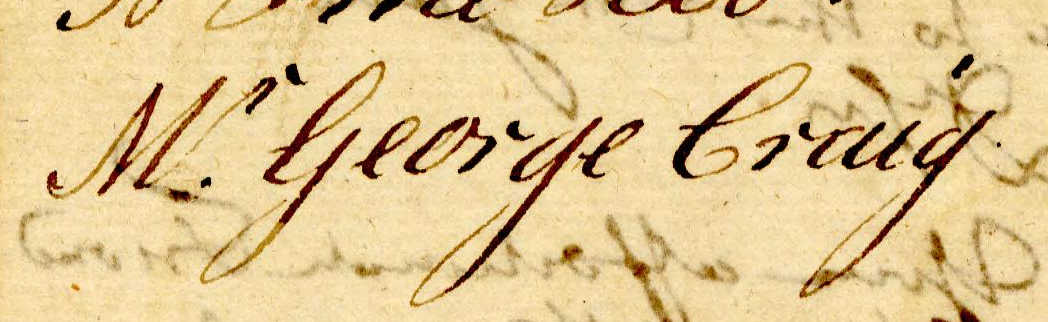M^r. George Craig
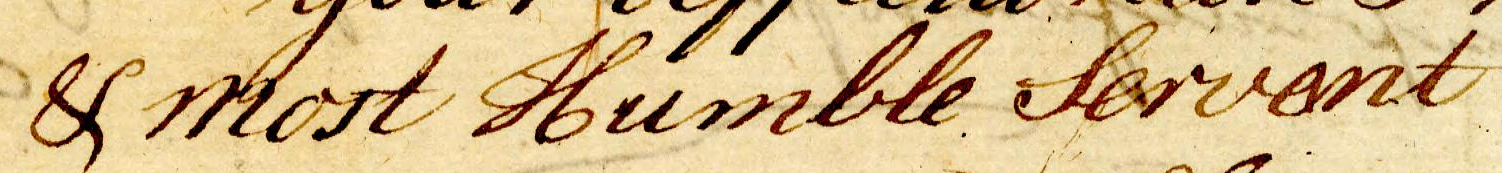& most Humble Servant
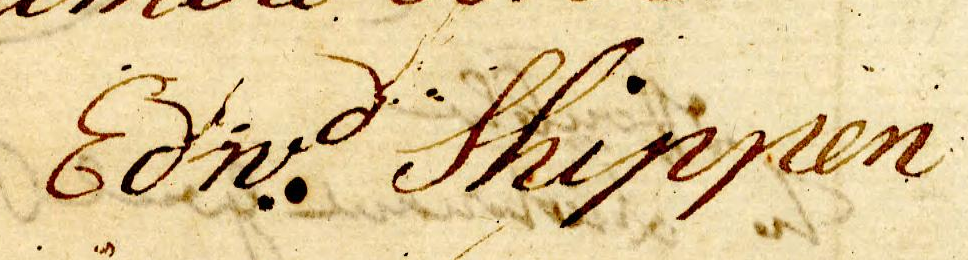Edw:^d Shippen
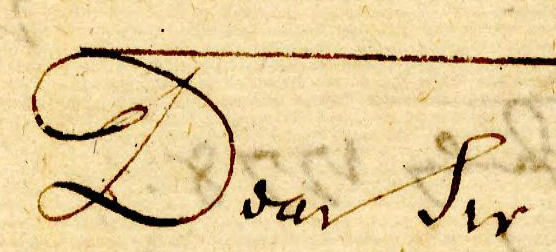Dear Sir
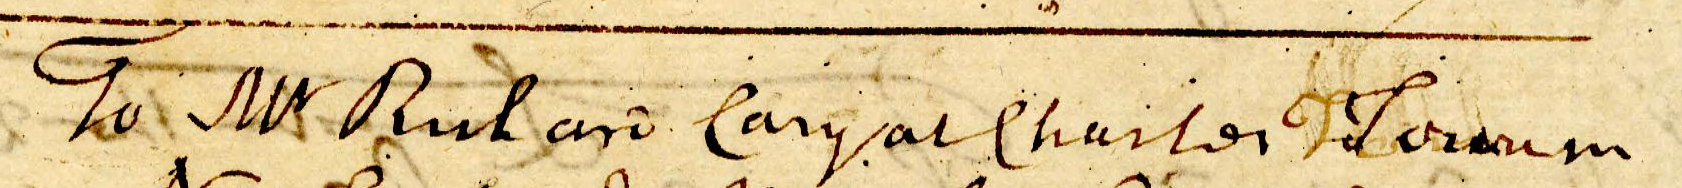To M^r Richard Cary at Charles Town in
